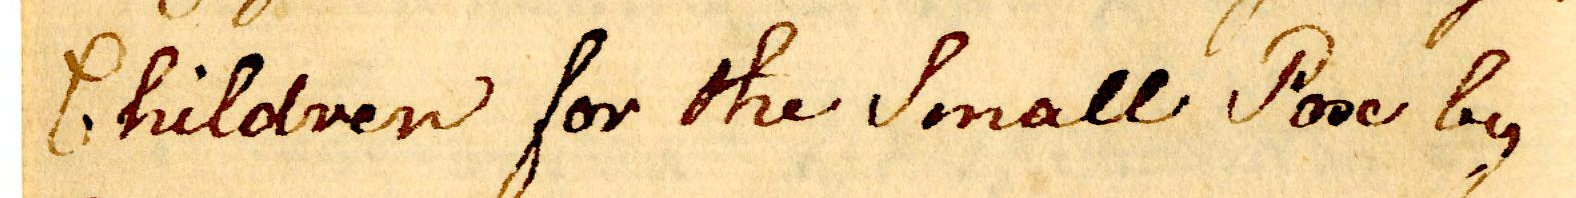Children for the Small Pox by
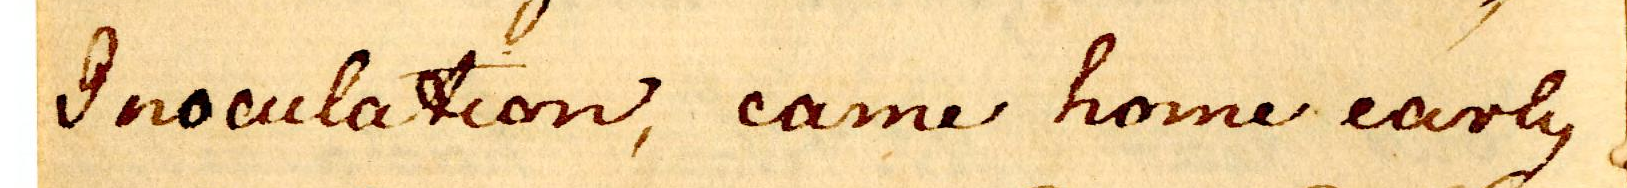Inoculation, came home early
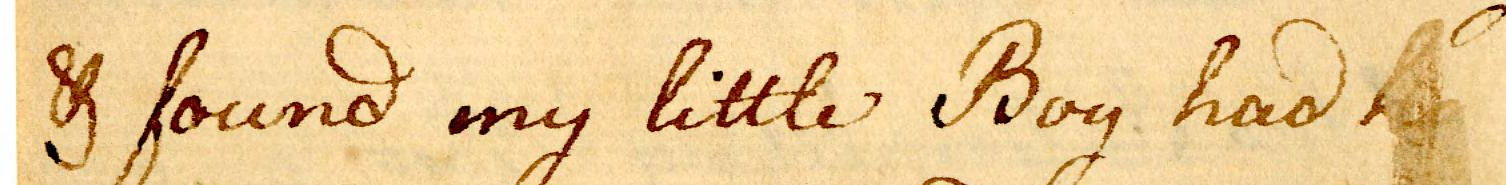& found my little Boy had [___]
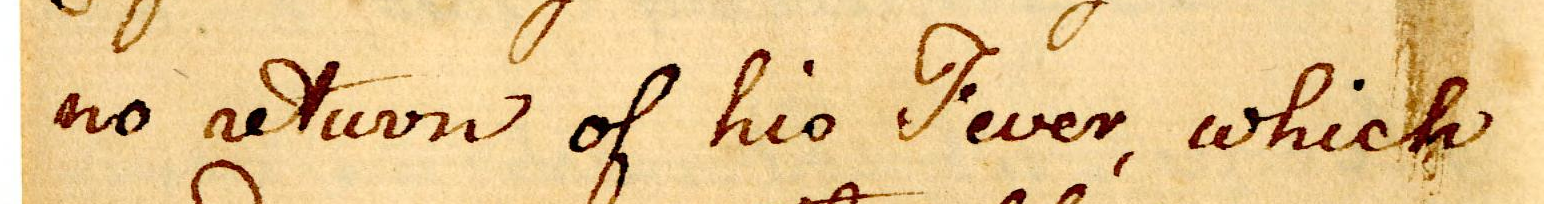no return of his Fever, which
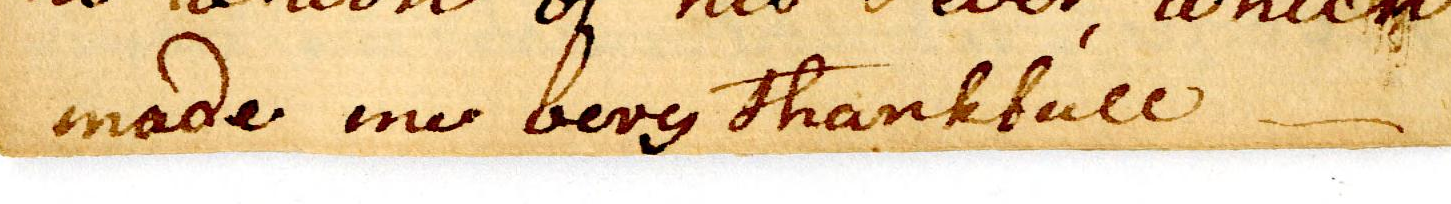made me very thankfull
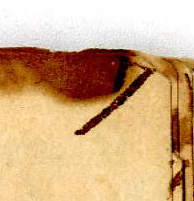7
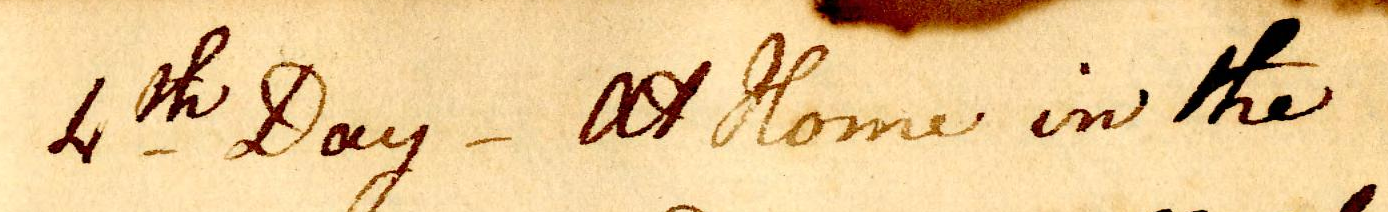4^th Day- At Home in the
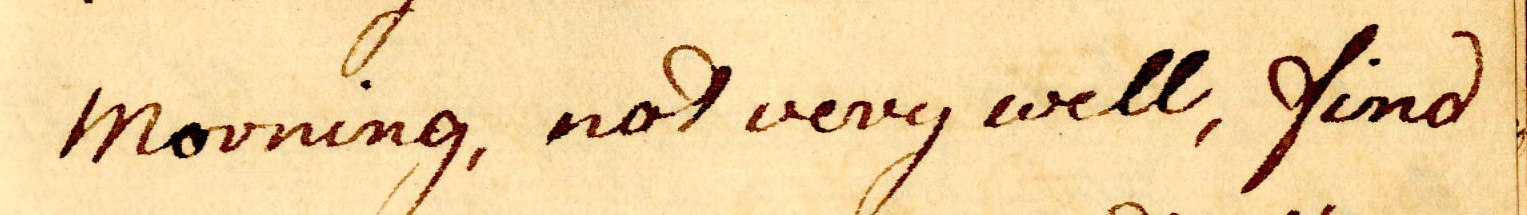Morning, not very well, find
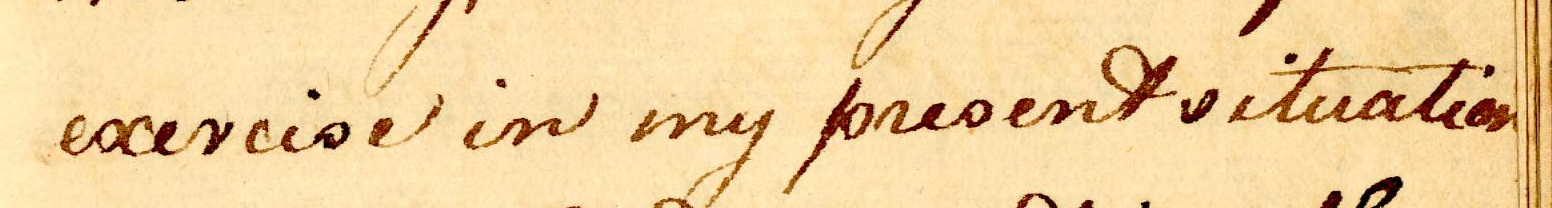exercise in my present situation
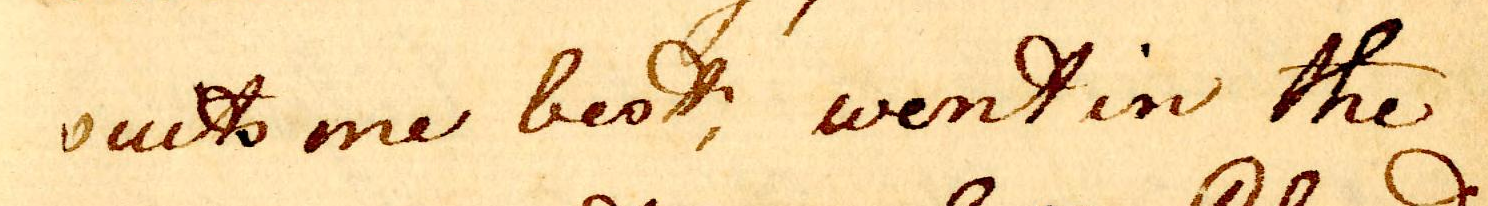suits me best, went in the
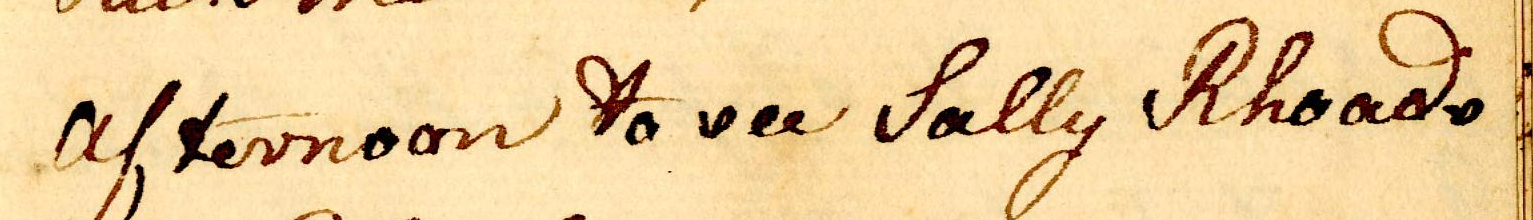Afternoon to see Sally Rhoads
